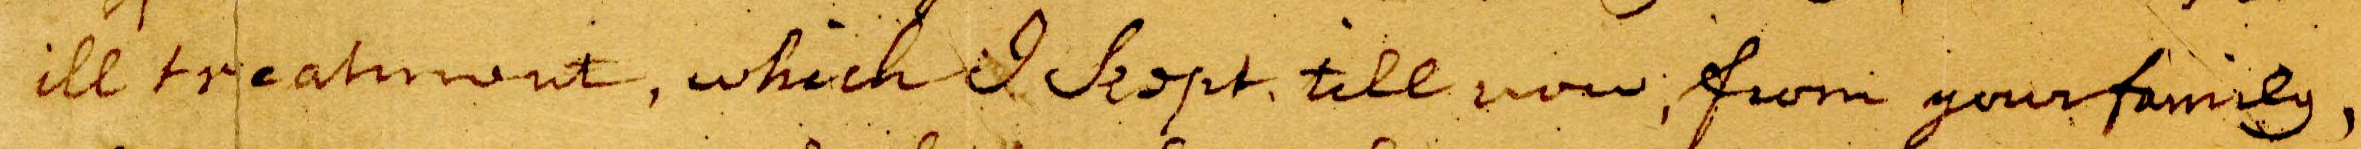ill treatment, which I kept till now from your family,
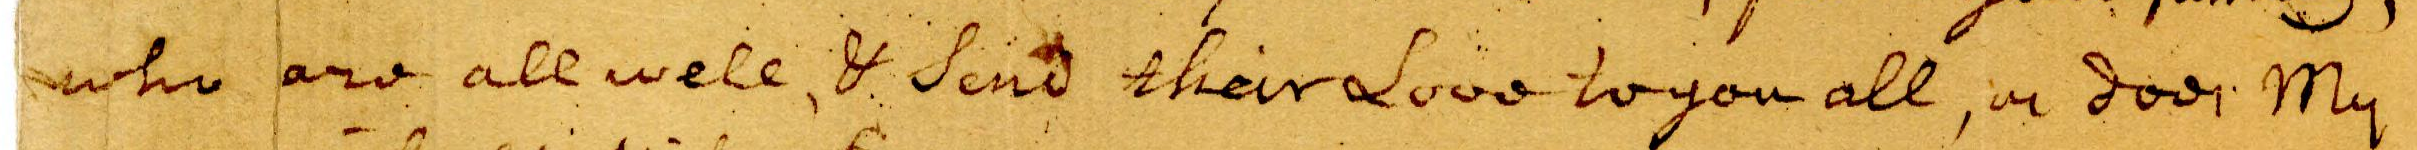who are all well & Send their Love to you all, &c; My
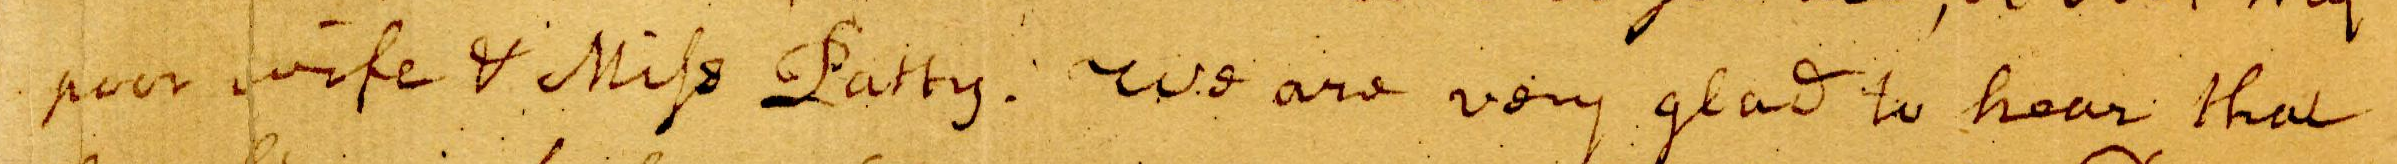poor wife & Miss Patty. We are very glad to hear that
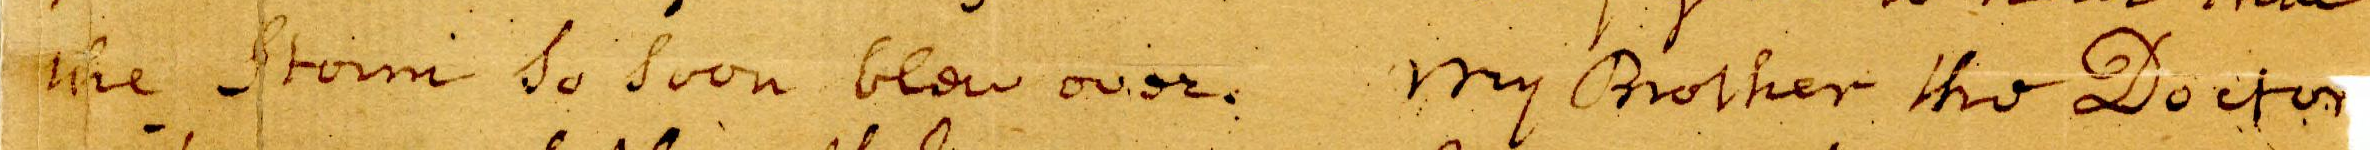the Storm so soon blow over. My Brother tho Doctor
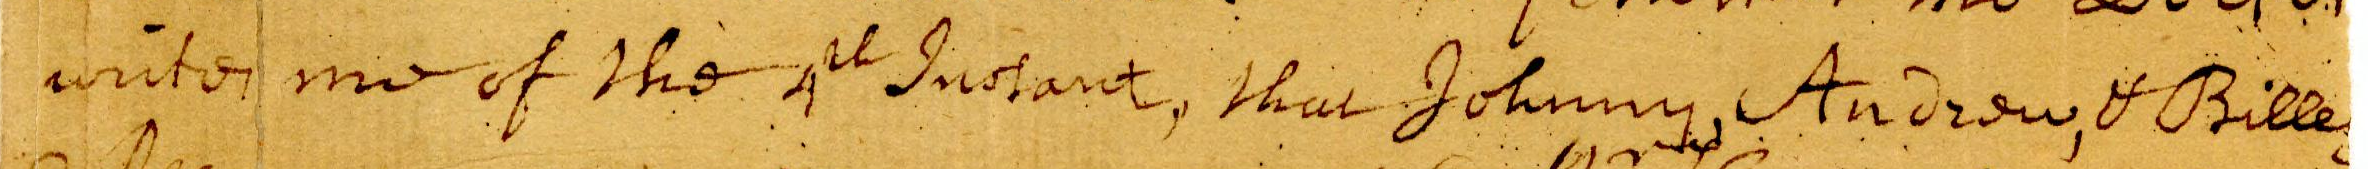write me of the 4^th Instant, that Johnny, Andrew, & Bille
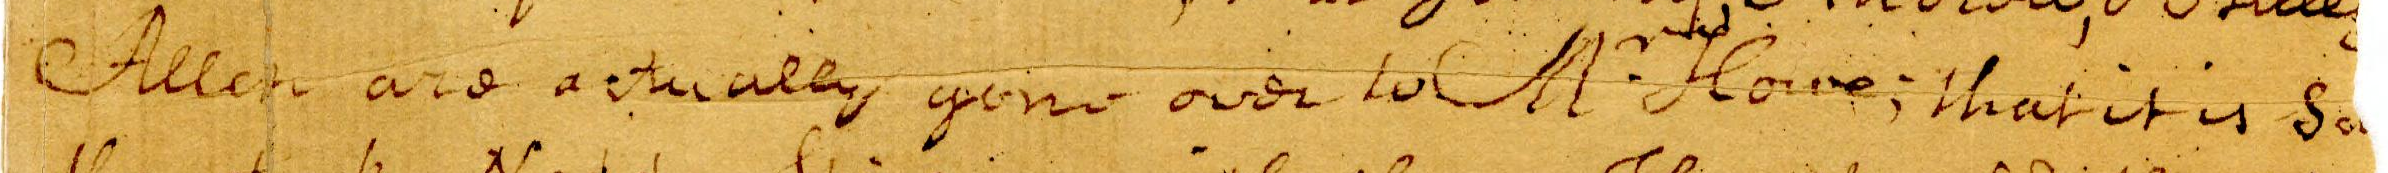Allen are actually going over to M^r Howe; that it is So
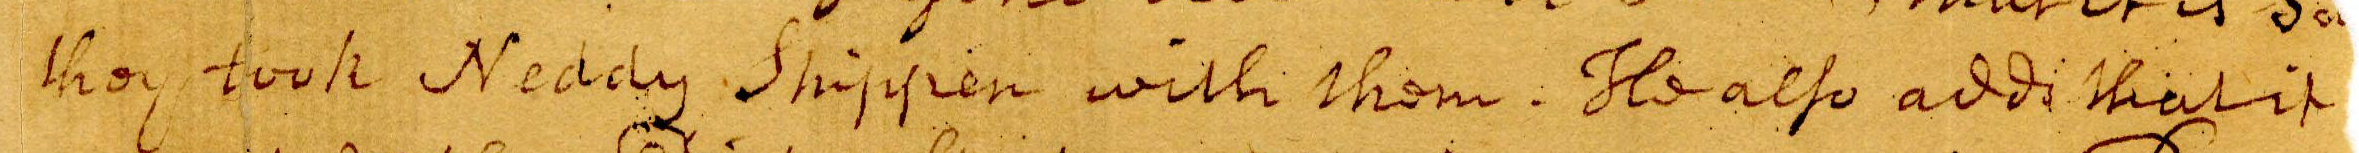they took Neddy Shippen with them. He also adds that it
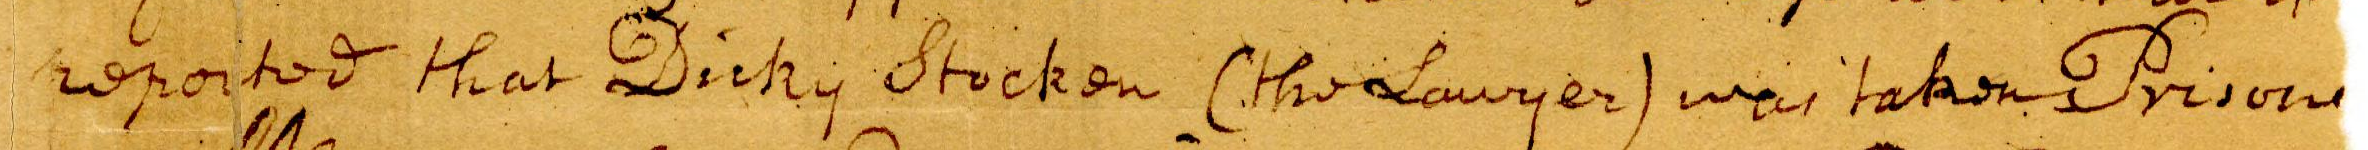reported that Dicky Stocken (the Lawyer) was taken Prisoner
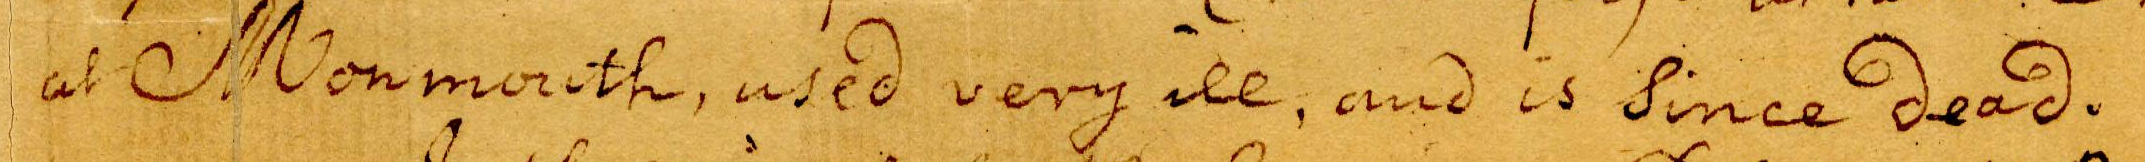at Monmouth, used very ill, and is since dead.
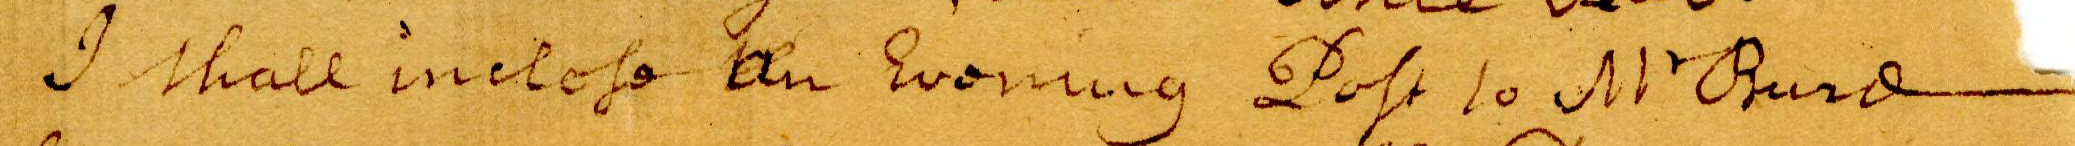I shall inclose an Evening Post to M^r Burd
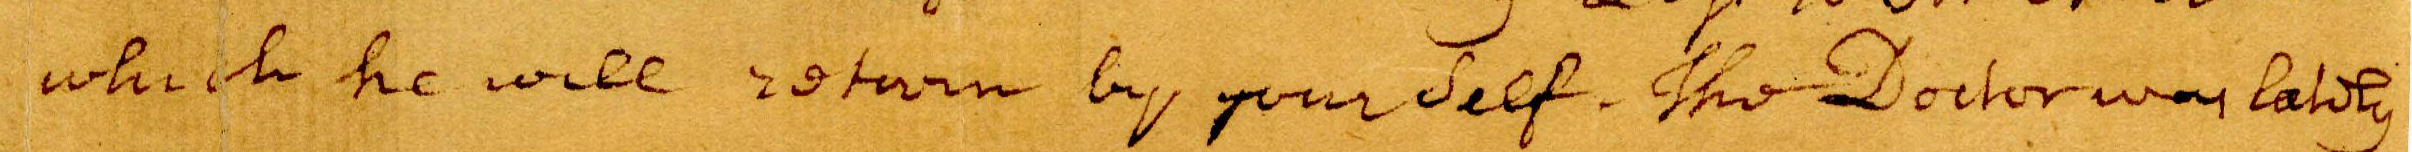which he will return by your self. The Doctor was lately
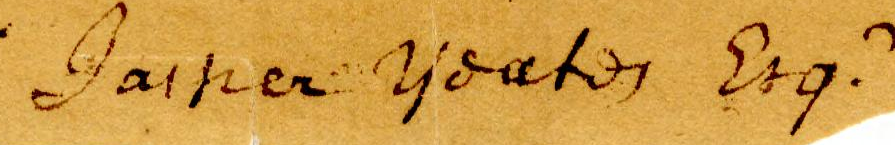Jasper Yeates Esq^r.
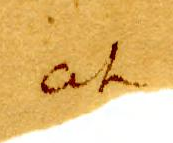at
